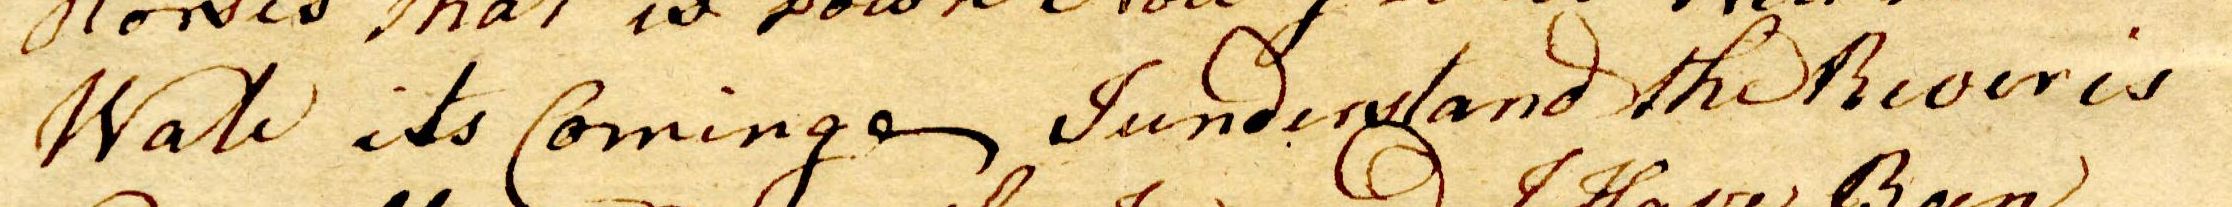Wate its Cominge, I understand the River is
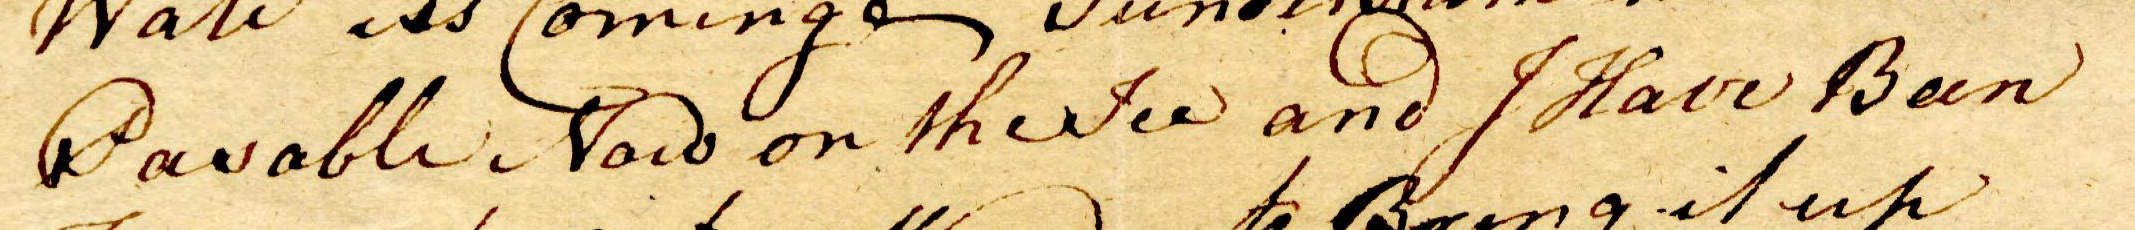Pasable Now on the See and I Have Been
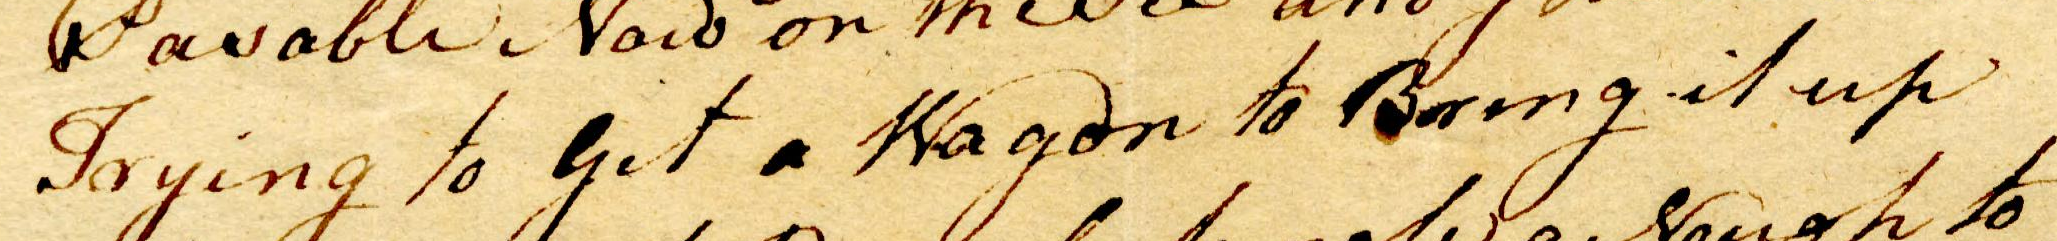Trying to Get a wagon to Bring it up
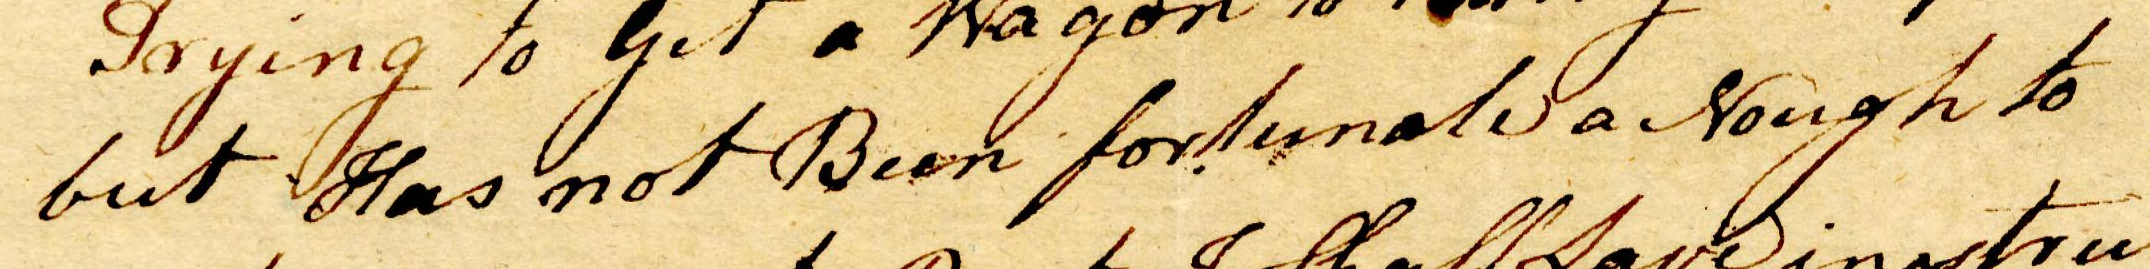but Has not Been fortunate a Nough to
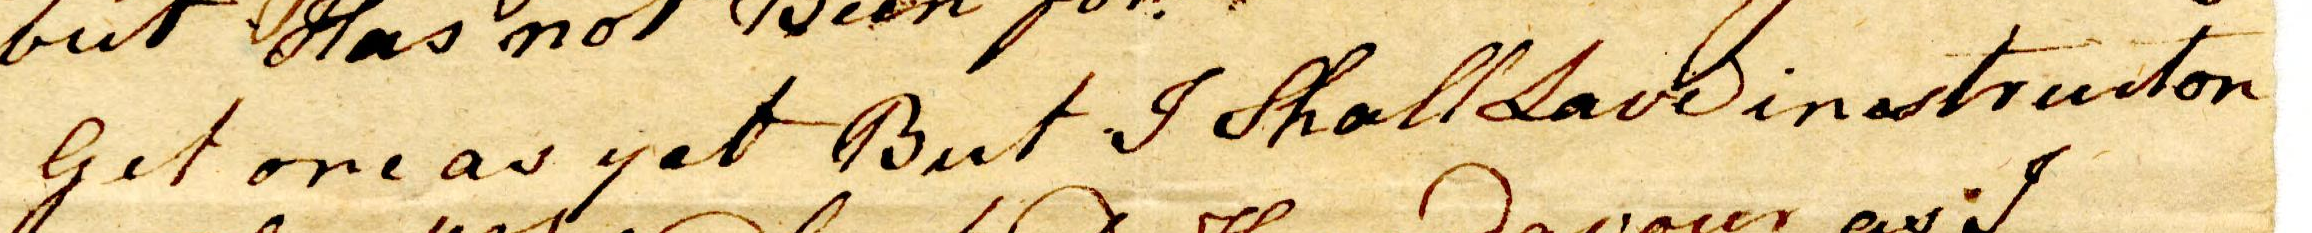Get one as yet But I Shall have instruction
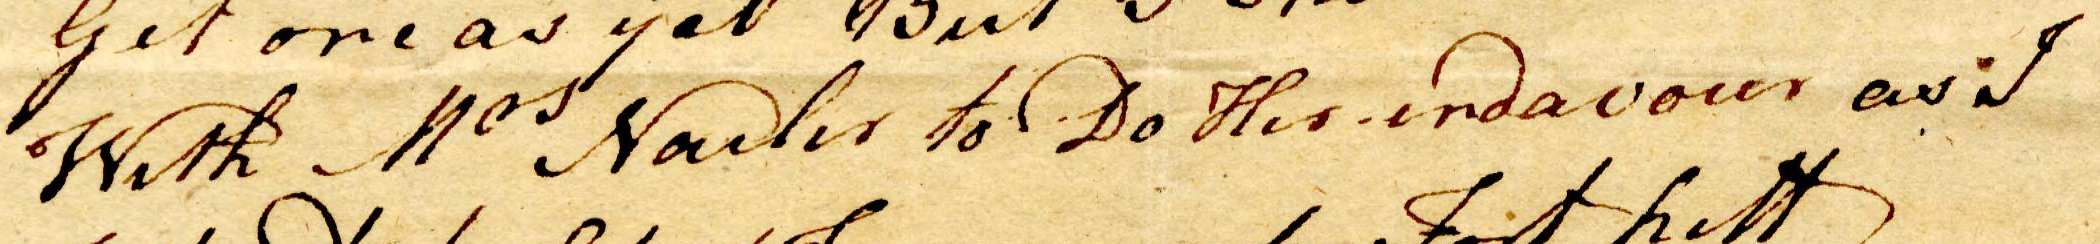With M^rs Naier to Do his endavour as I
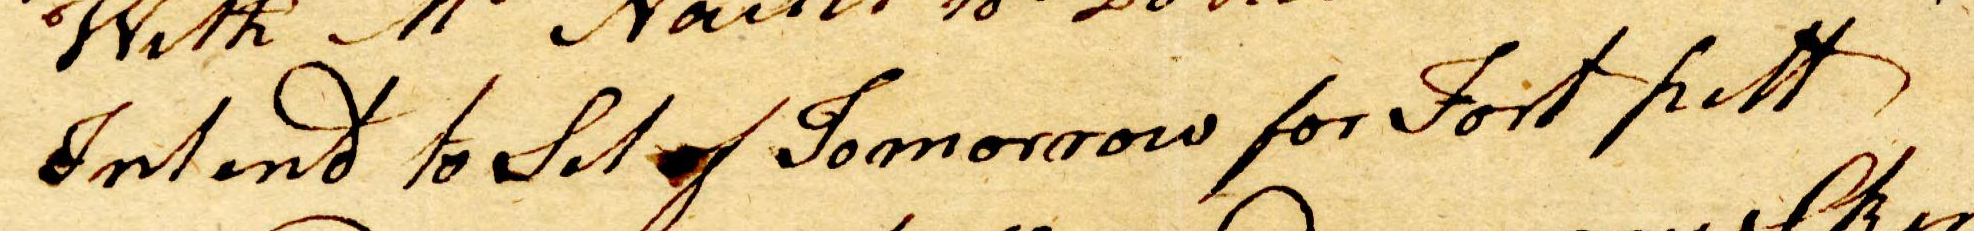Intend to Set of Tomorrow for Fort Pitt
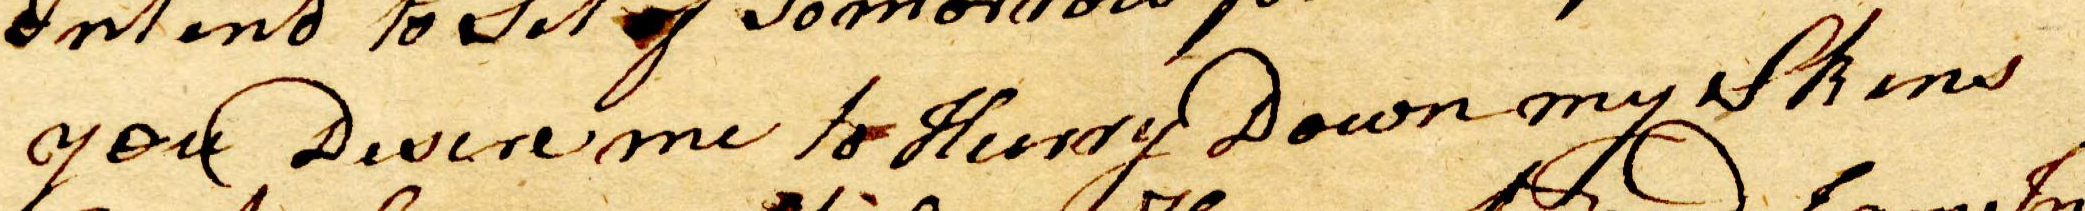you Desire me to Hurry Down my Skins
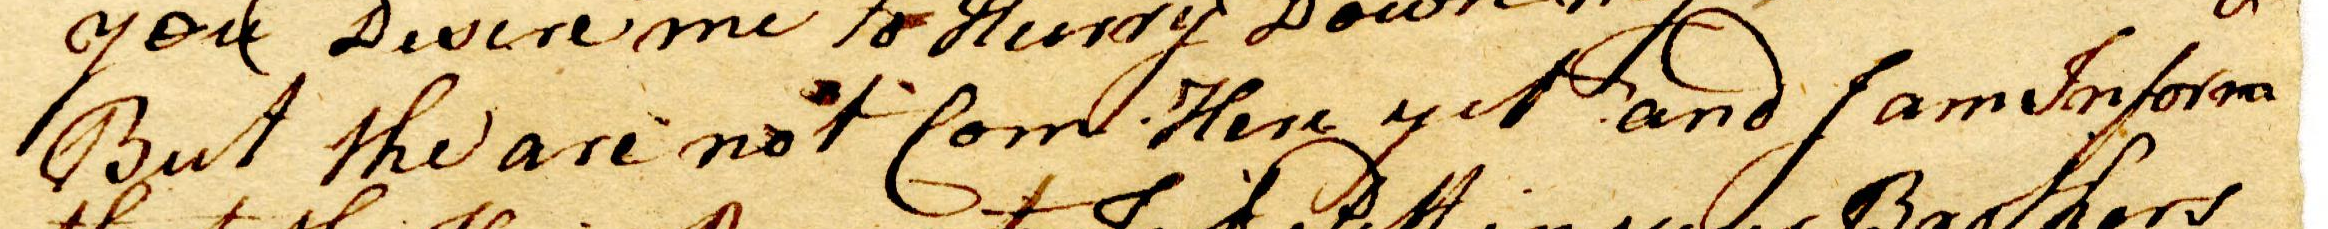But the are not com Here yet and I am Inform
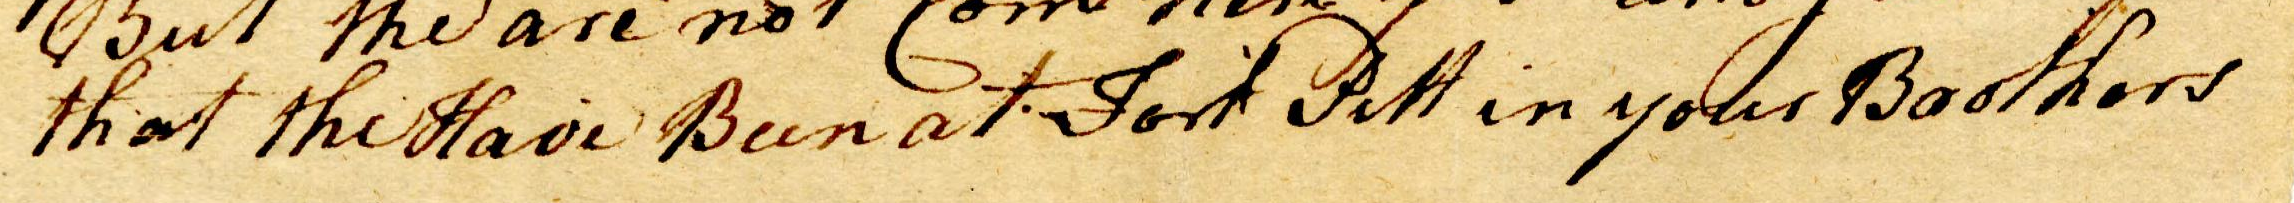that the Have Been at Fort Pitt in your Brothers
